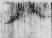八
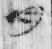月
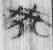癸
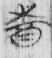梄（酉）
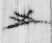之
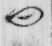日
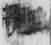邸
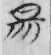昜（陽）
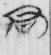君
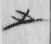之
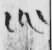州
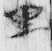里
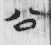公
